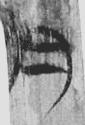於
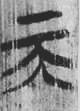天
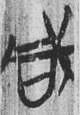咸
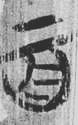百
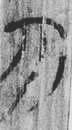勿（物）
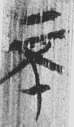不
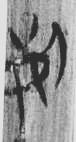死
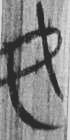女（如）
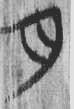月
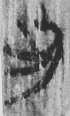出
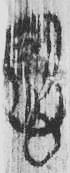惻（則）
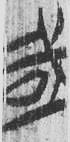或（又）
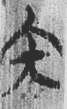內（入）
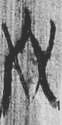夂（終）
